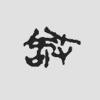敬
